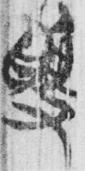受（授）
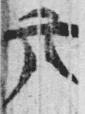亓（其）
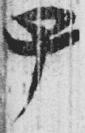子
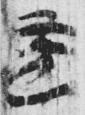而
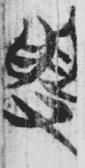受（授）
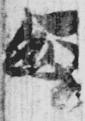臤（賢）
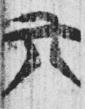亓（其）
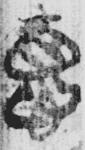惪（德）
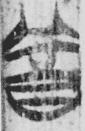酋
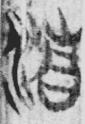清
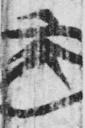而
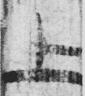上
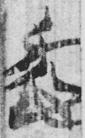○（愛）
